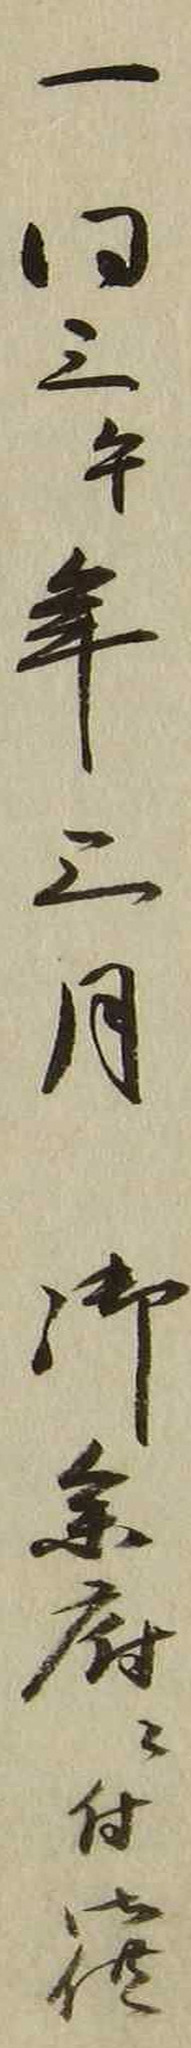一同三午年三月御参府ニ付御供
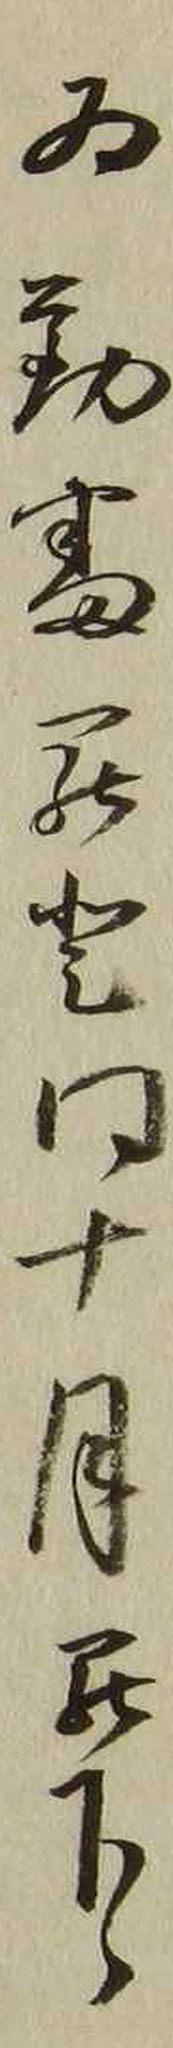為勤番罷登同十月罷下候
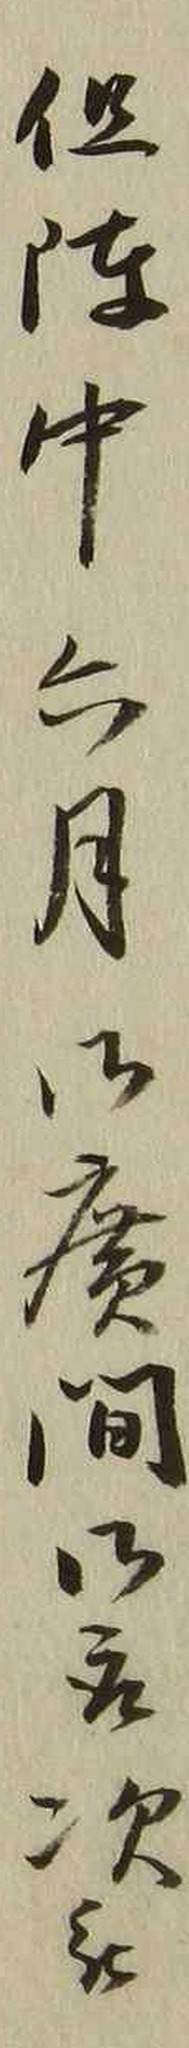但陣中六月御広間御取次被
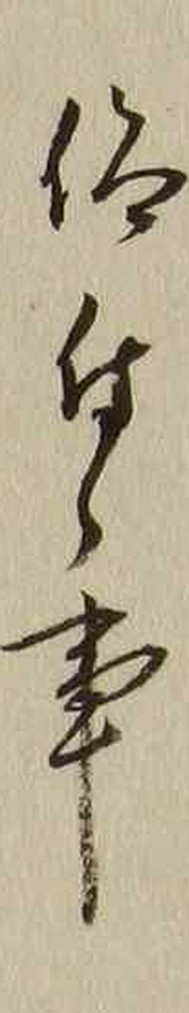仰付候事
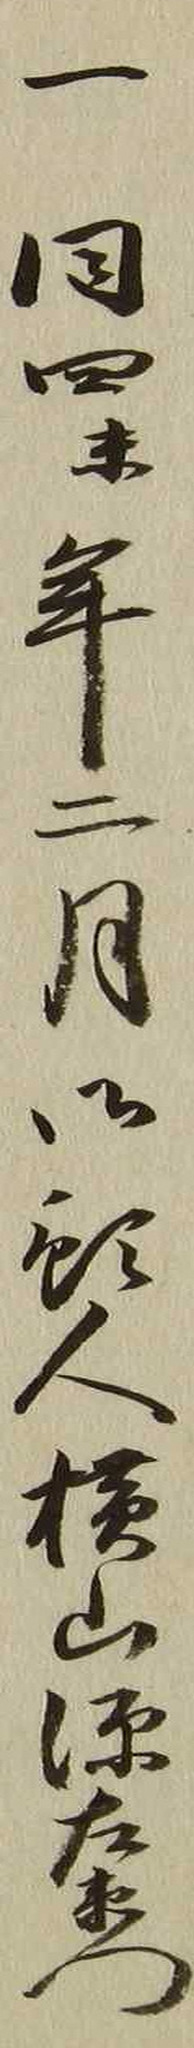一同四未年二月御預人横山源左衛門
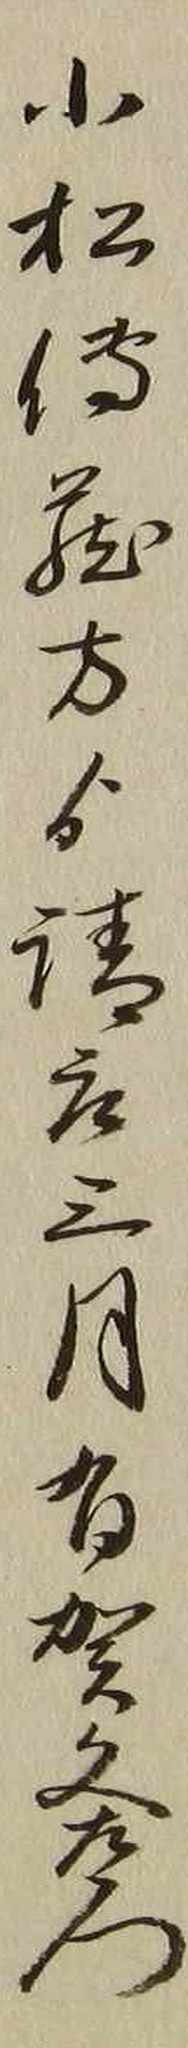小松伝蔵方ゟ請取三月有賀久左衛門
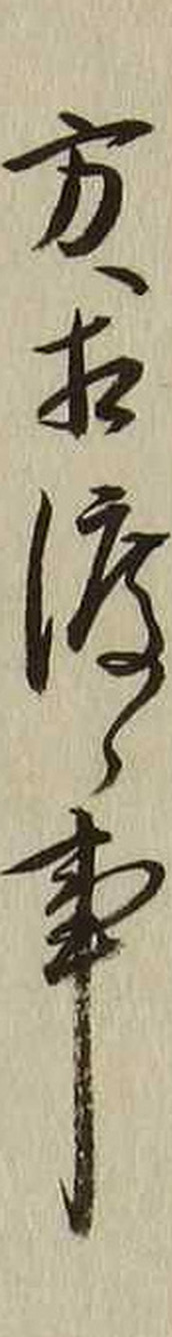方へ相渡候事
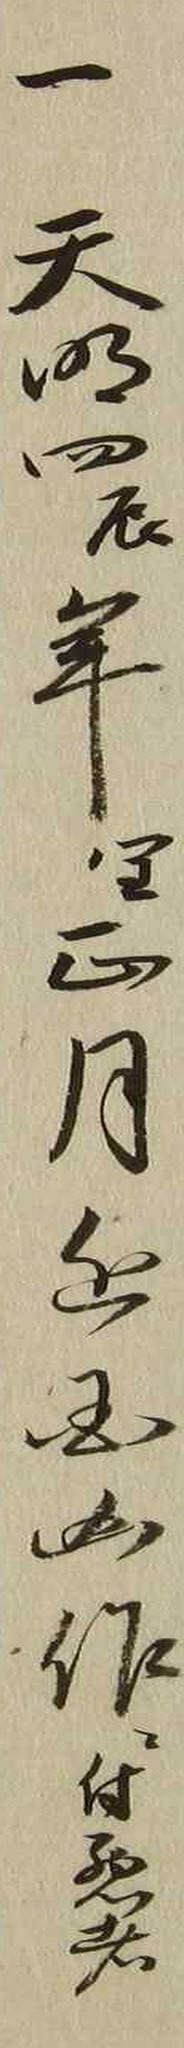一天明四辰年閏正月近国凶作ニ付悪者
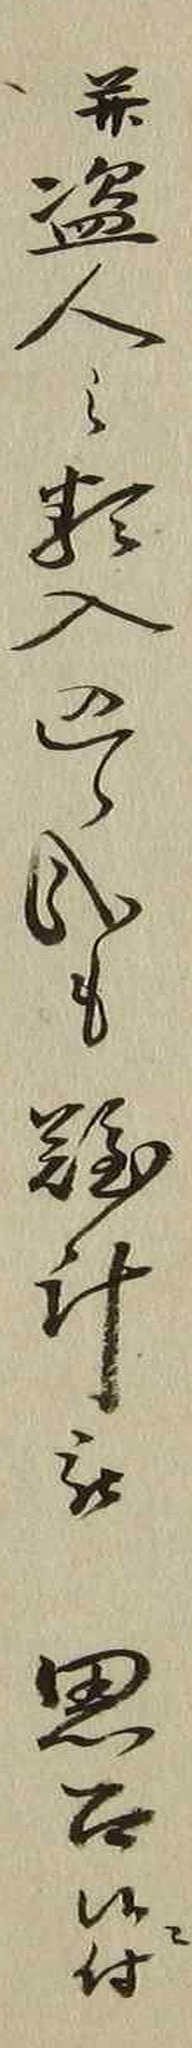幷盗人之類入込候哉も難計被思召候ニ付
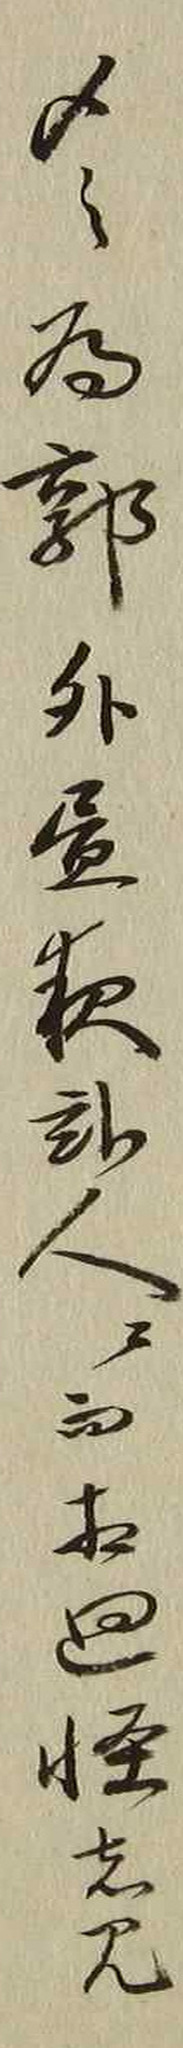〆之為郭外昼夜弐人ニ而相廻怪者見
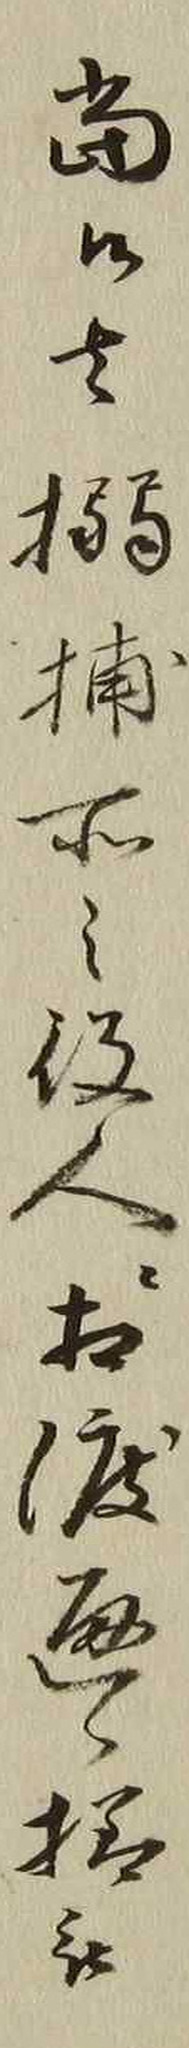当候者搦捕所之役人ニ相渡通候様被
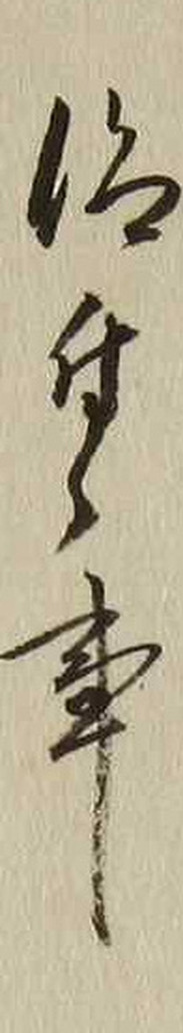仰付候事
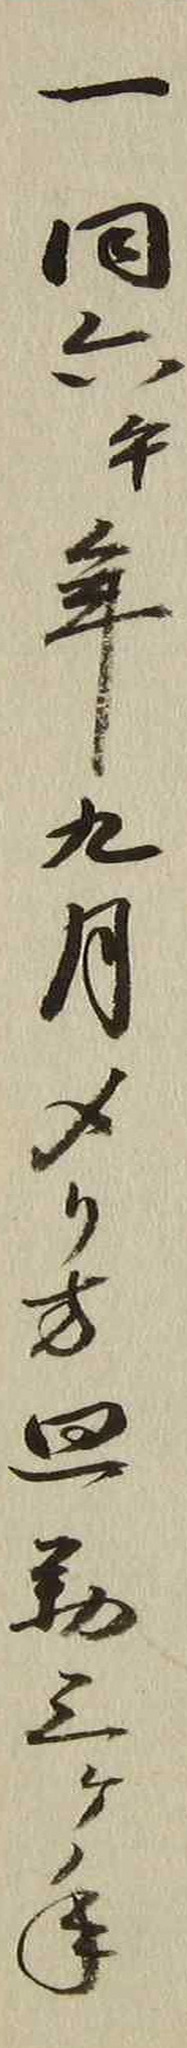一同六午年九月〆り方廻勤三ヶ年
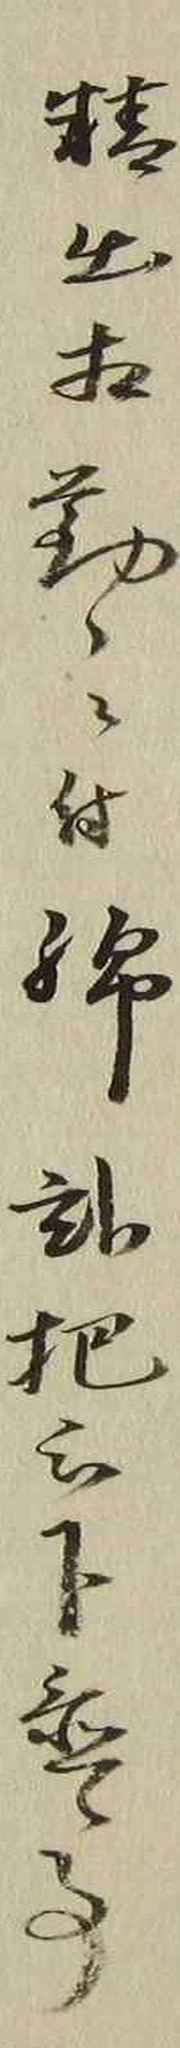精出相勤候ニ付綿弐把被下置候事
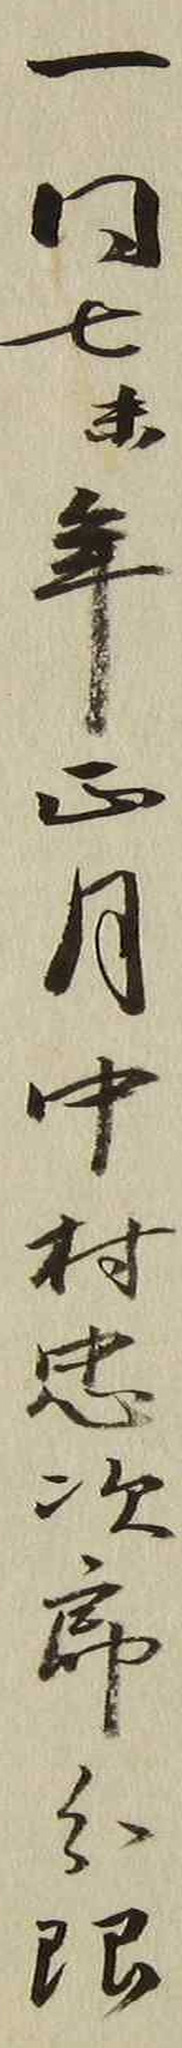一同七未年正月中村忠次郎分限
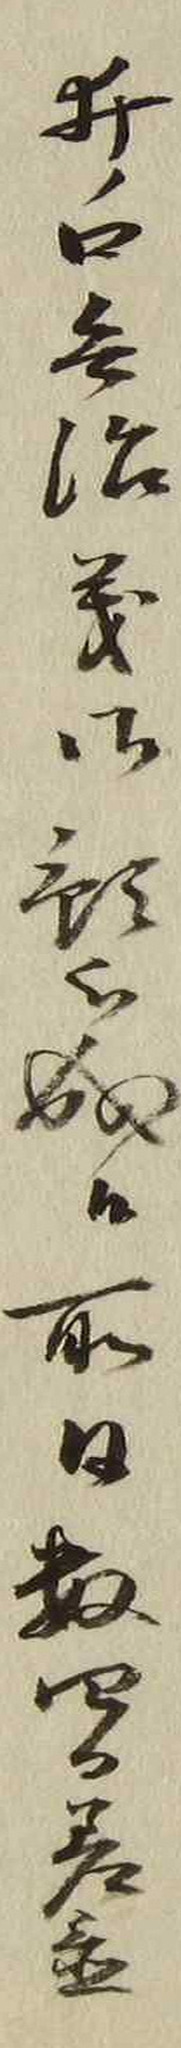井ノ口兵治義御預被成候所日数四日差置
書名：諸士系譜　巻之69　を之部3
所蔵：会津若松市立会津図書館
